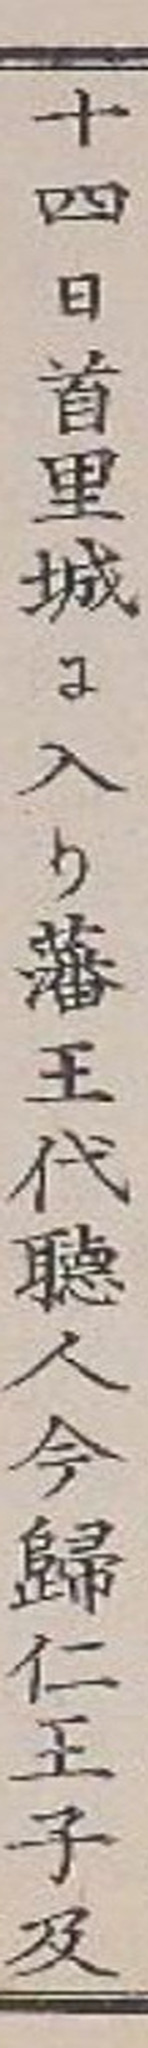十四日首里城に入り藩王代聴人今帰仁王子及
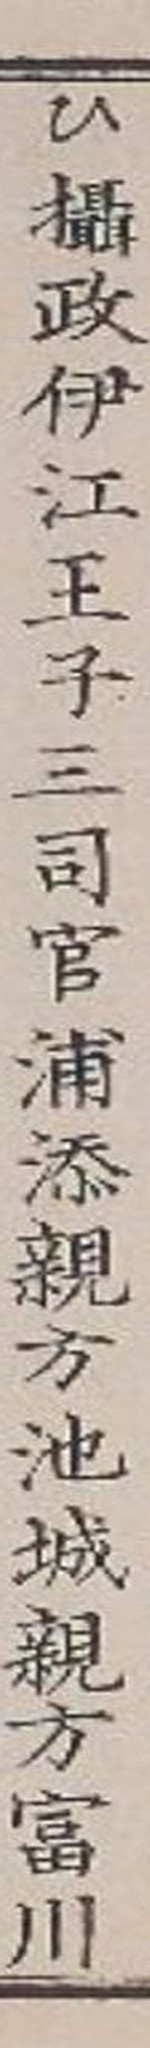ひ摂政伊江王子三司官浦添親方池城親方富川
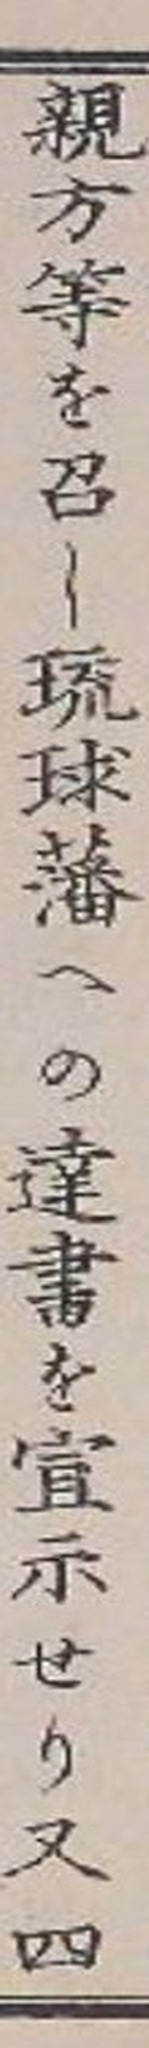親方等を召し琉球藩への達書を宣旨せり又四
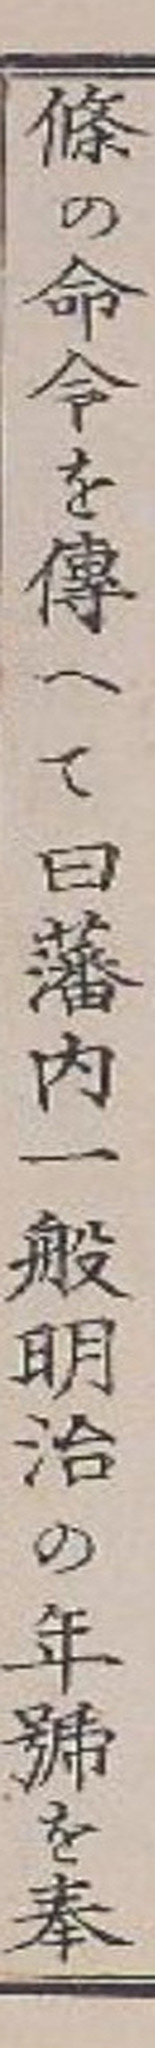条の命令を伝へて曰藩内一般明治の年号を奉

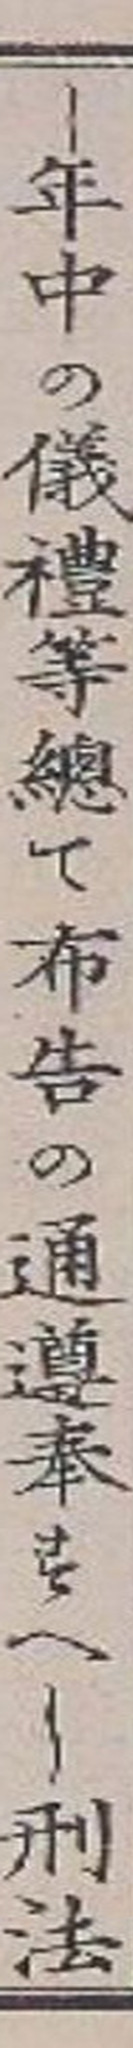し年中の儀礼等総て布告の通遵奉すへし刑法
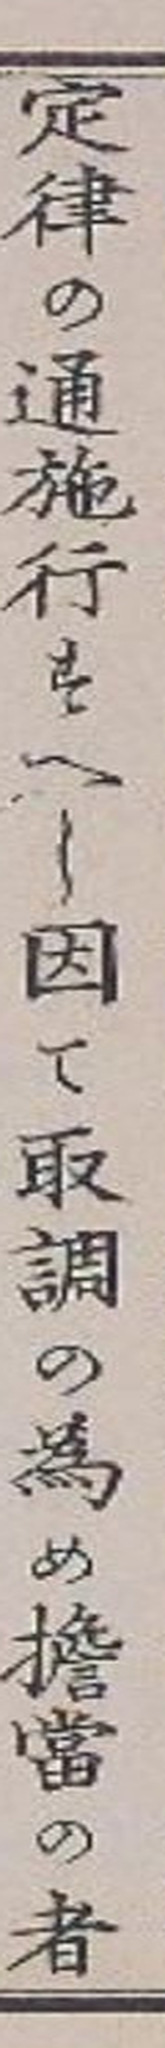定律の通施行すへし因て取調の為め担当の者
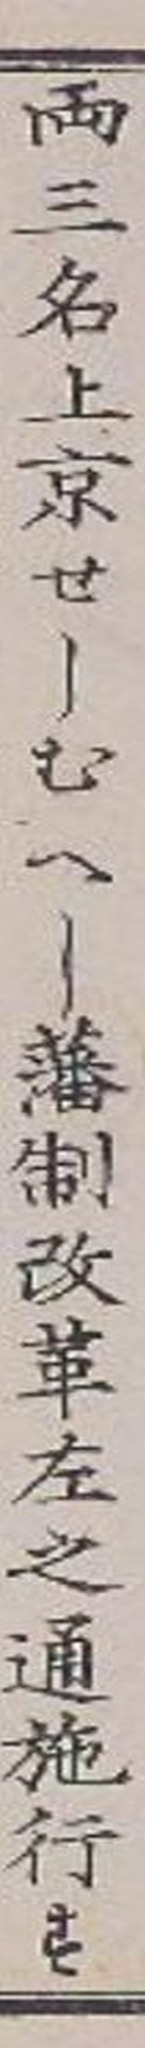両三名上京せしむへし藩政改革左の通施行す
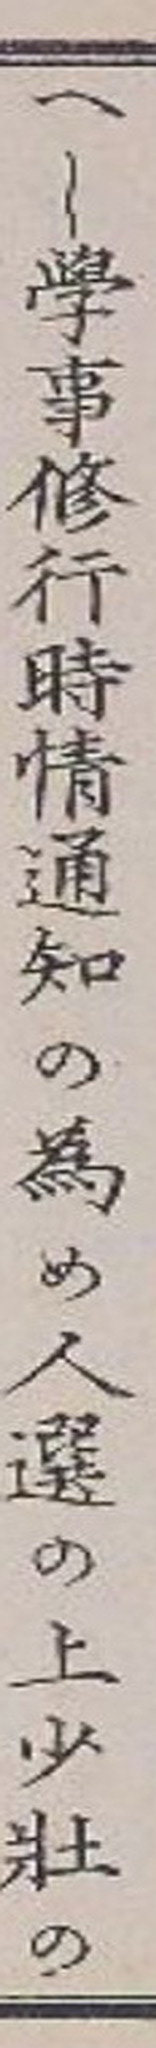へし学事修行時情通知の為め人選の上少壮の
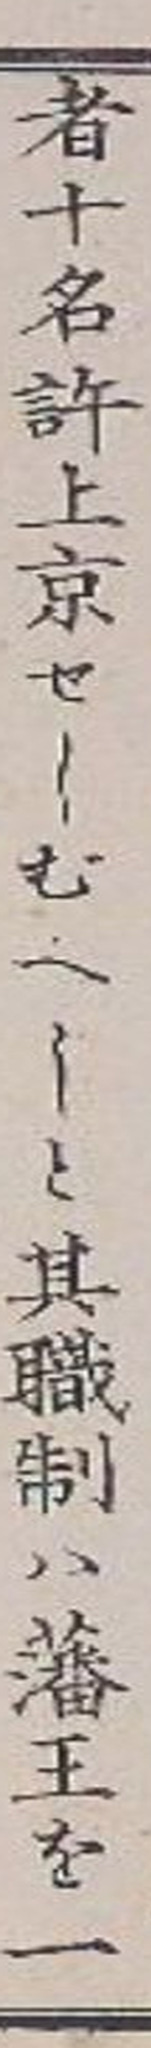者十名許上京せしむへしと其職制は藩王を一
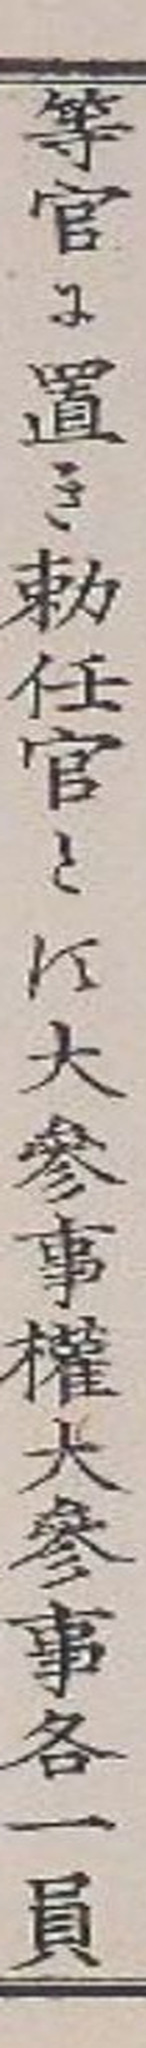等官に置き勅任官とす大参事権大参事各一員
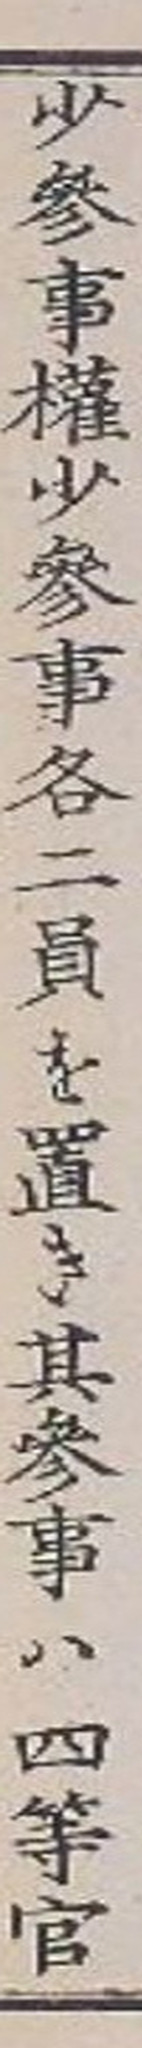少参事権少参事各二員を置き其参事は四等官
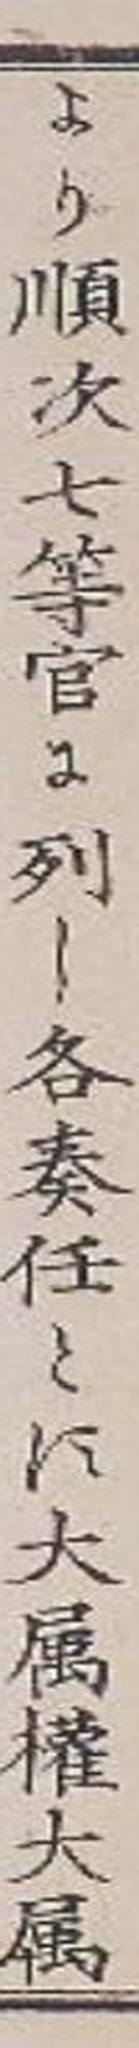より順次七等官に列し各奏任とす大属権大属
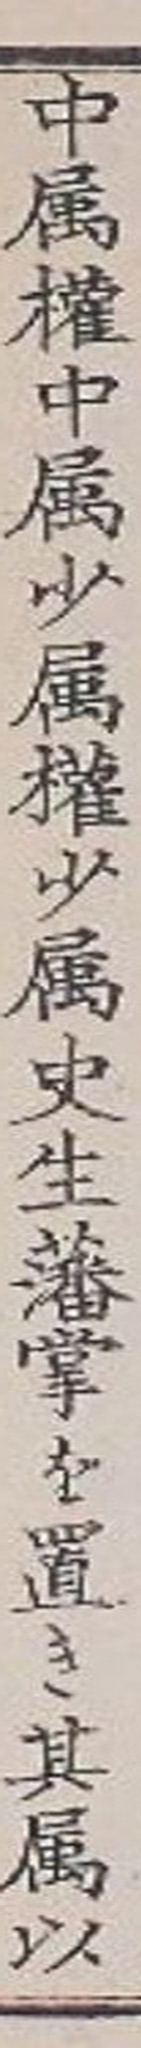中属権中属少属権少属史生藩掌を置き其属以
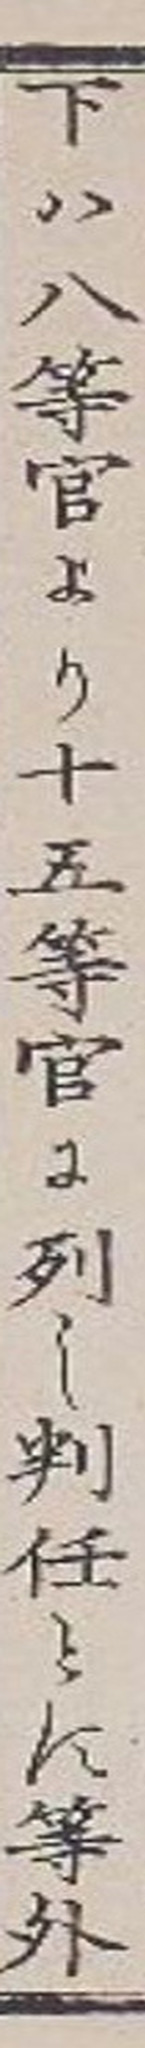下は八等官より十五等官に列し判任とす等外
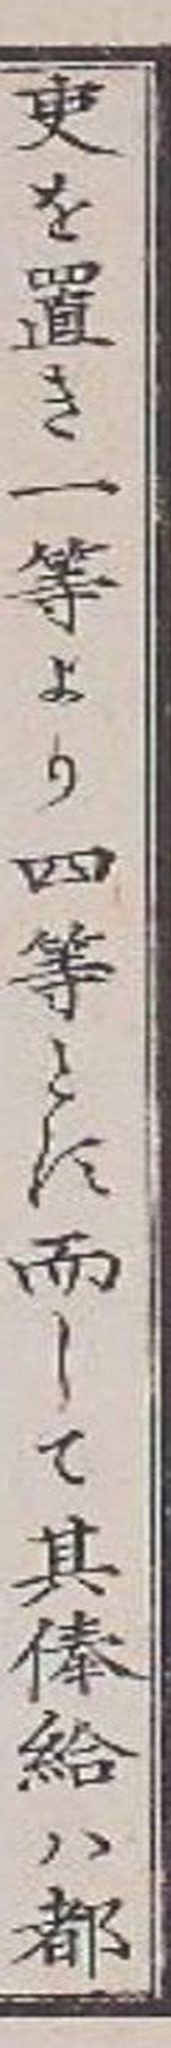吏を置き一等より四頭とす而して其俸給は都
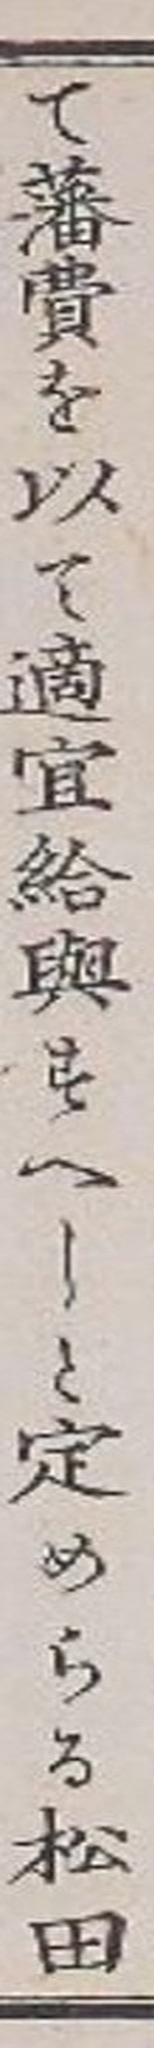て藩費を以て適宜給与すへしと定めらる松田
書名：南島紀事 下
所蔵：University of the Ryukyus Library
